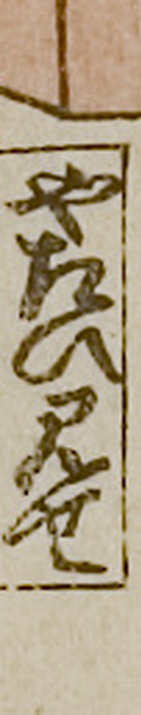やたいみせ
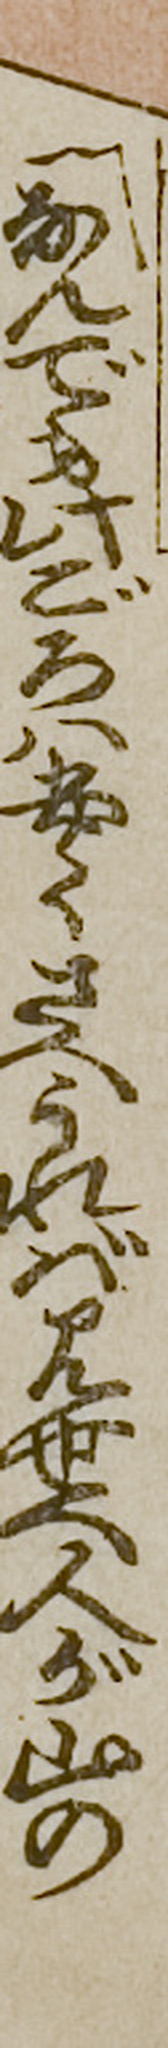〽なんでも此ごろは安くさへうればみせへ人が山の
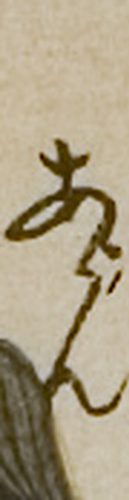あらん
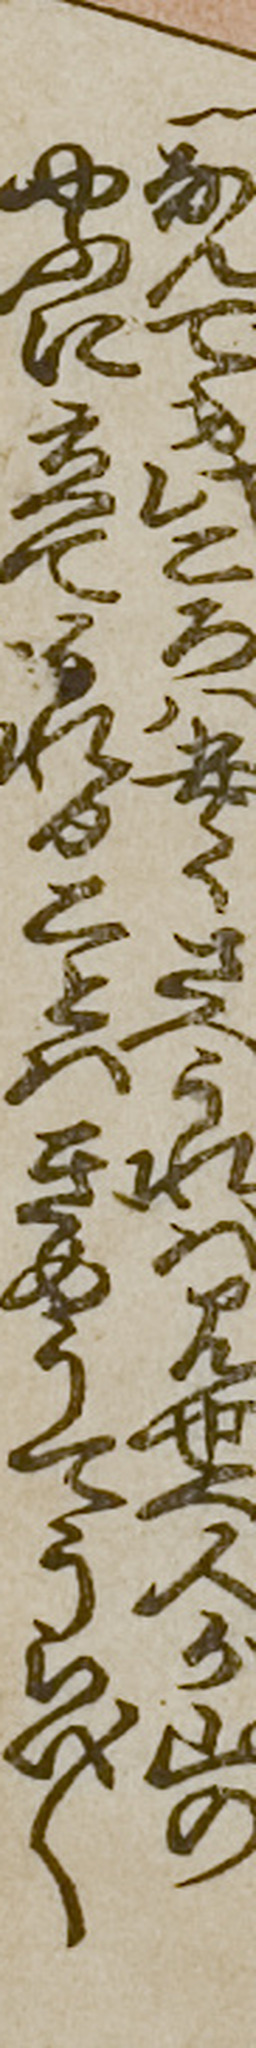やふに立てくれることはきめうてうらい〳〵
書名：万歳楽身の用心
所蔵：東京大学総合図書館 General Library in the University of Tokyo, JAPAN
